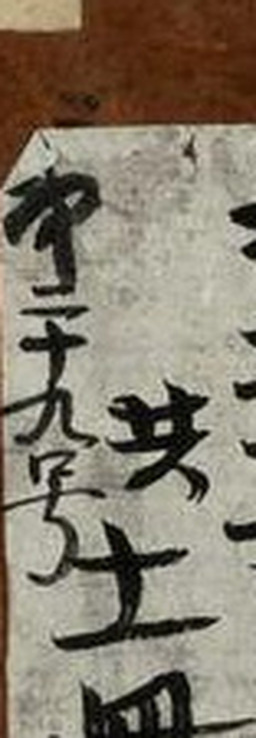第二十九号
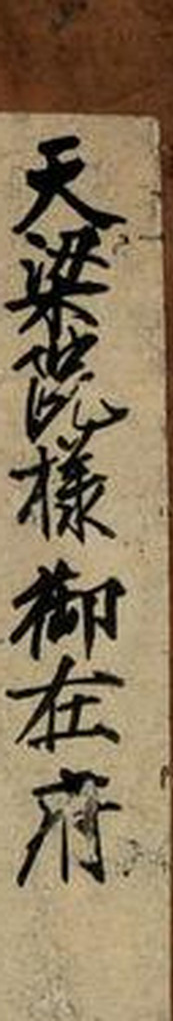天梁院様御在府
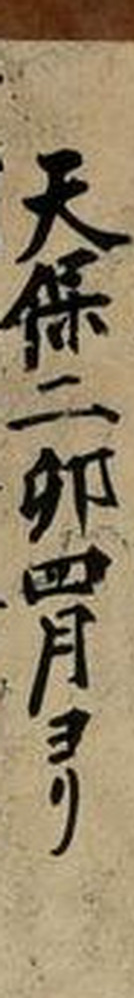天保二卯四月ヨリ
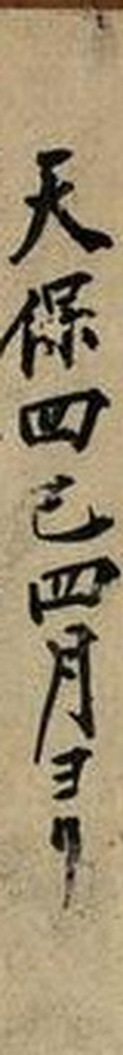天保四巳四月ヨリ
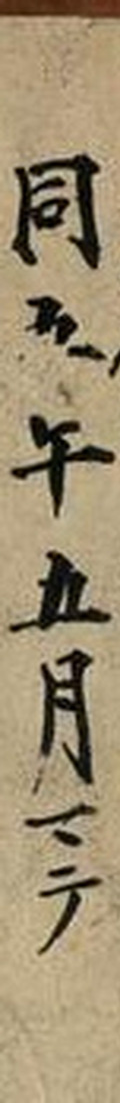同五午五月マテ
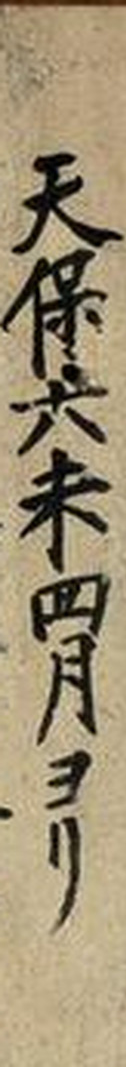天保六未四月ヨリ
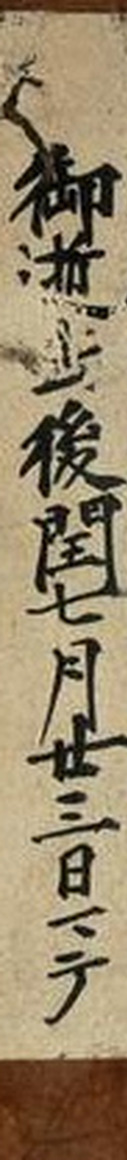御逝去後閏七月廿三日マテ
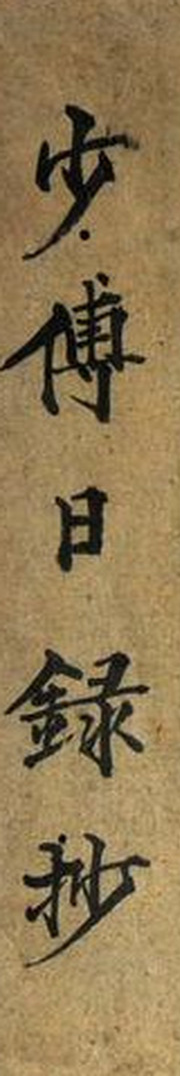少傅日録抄

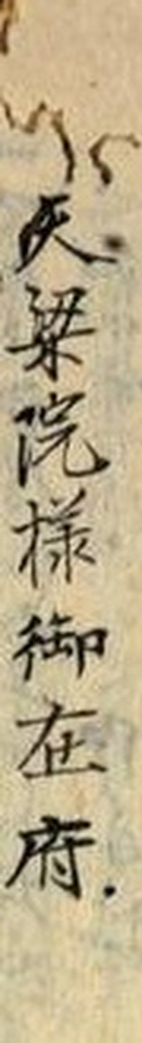天梁院様御在府
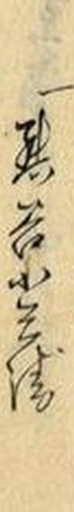熊谷小兵衛
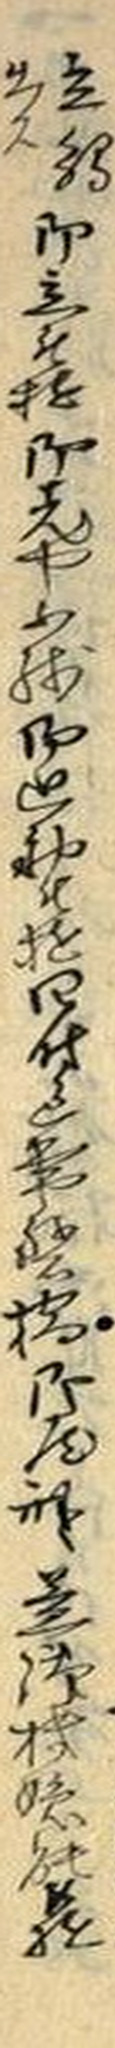立触出ス御立被遊御老中不残御廻勤被遊四時過常磐橋御屋形益御機嫌能被遊
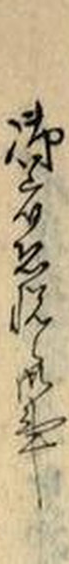御着恐悦之御事
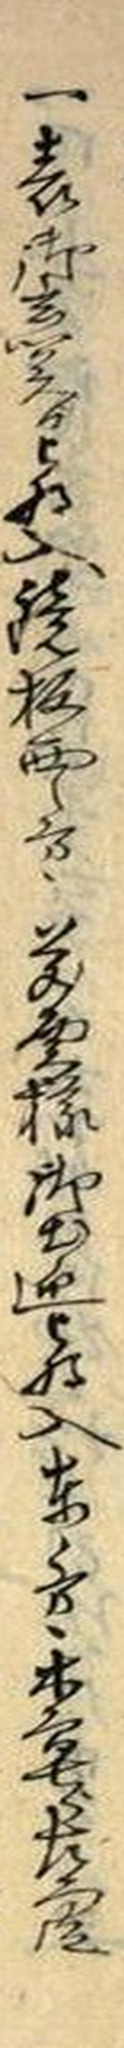一表御玄関ゟ被為入鏡板西之方へ若殿様御出迎被為入東之方へ木谷七郎左衛門殿
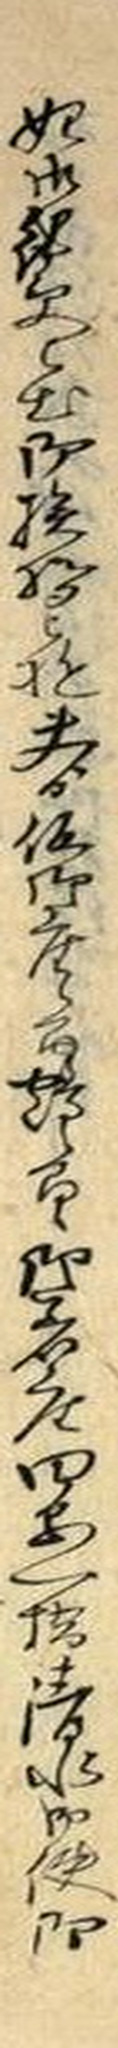始御待受被出御挨拶被遊夫ゟ仮御座之間鶴之間へ御着座田安一橋清水御使御
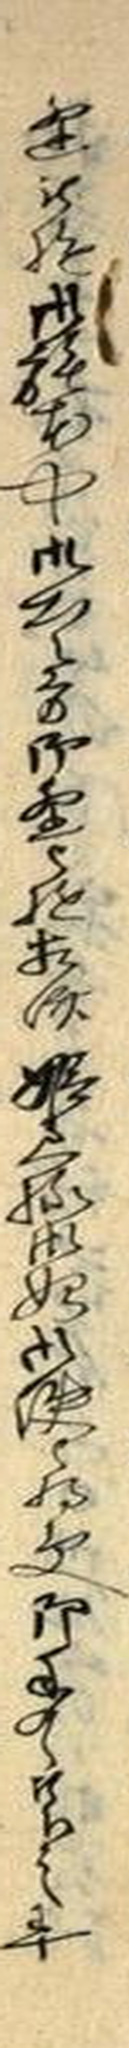逢被遊御旗本中御出之方御逢被遊相済姫君様御始御使被為受御手のし被下畢
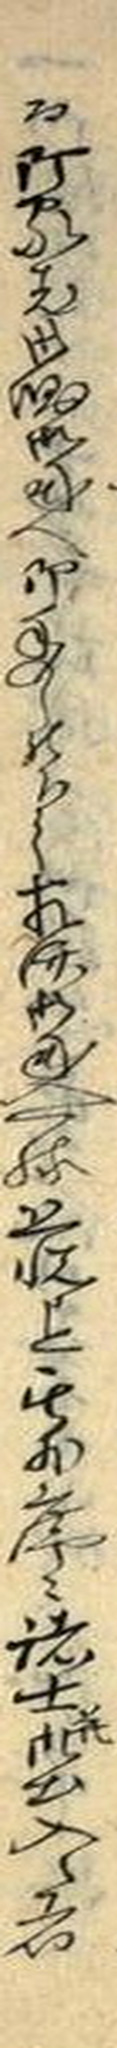而御家老御側御用人御手のし被下之相済御用人一統恐悦申上其外席々諸士并御出入之者
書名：少傅日録抄（斉承付側向頭取日記、在府）
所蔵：福井県文書館 Fukui Prefectural Archives
